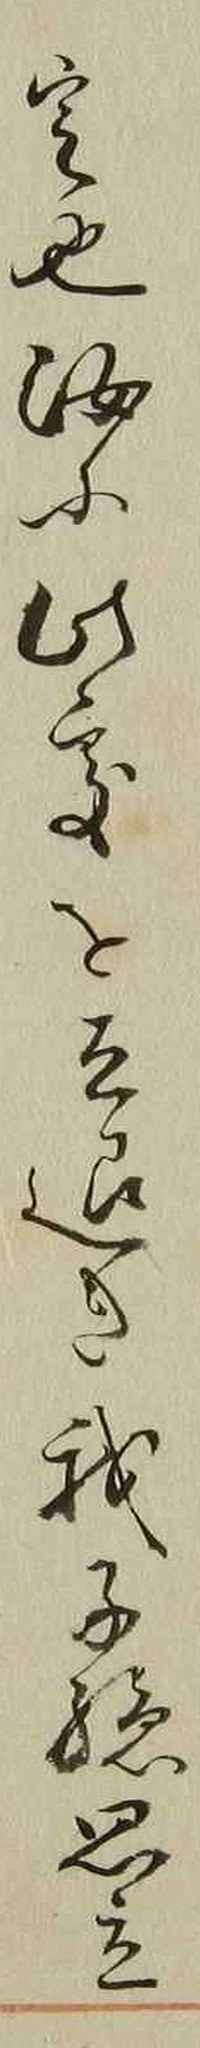定也汝に此処を立退き我子孫思立
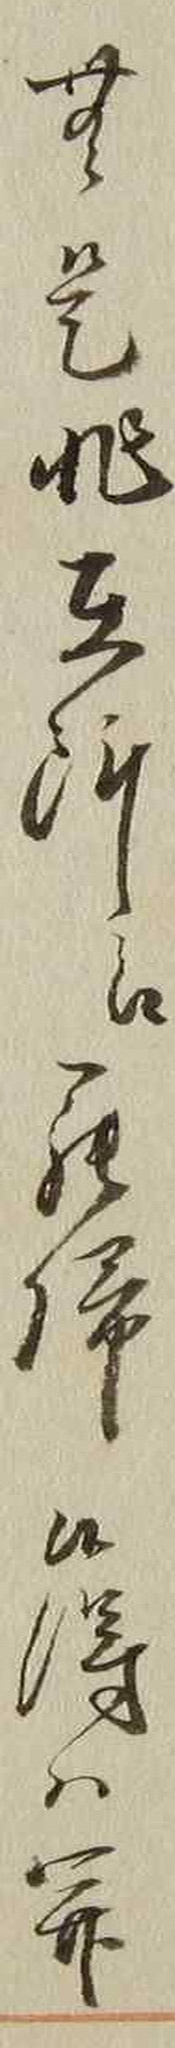無是非在所江罷帰候得ハ関
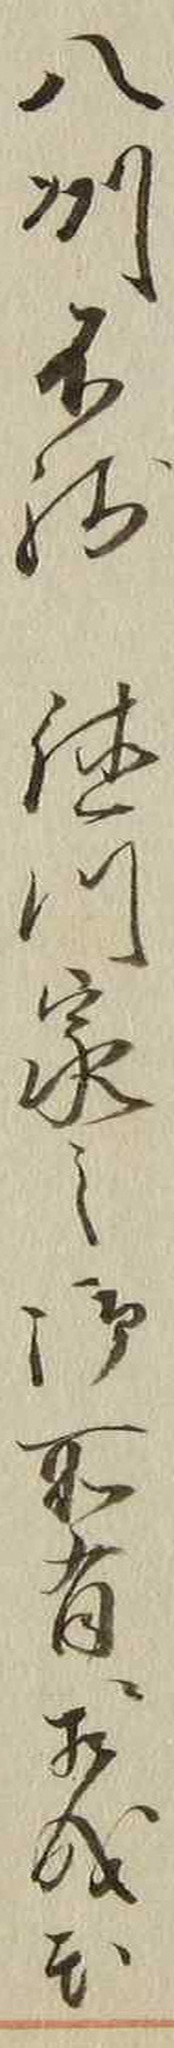八州不残徳川家之御所有ニ相成本
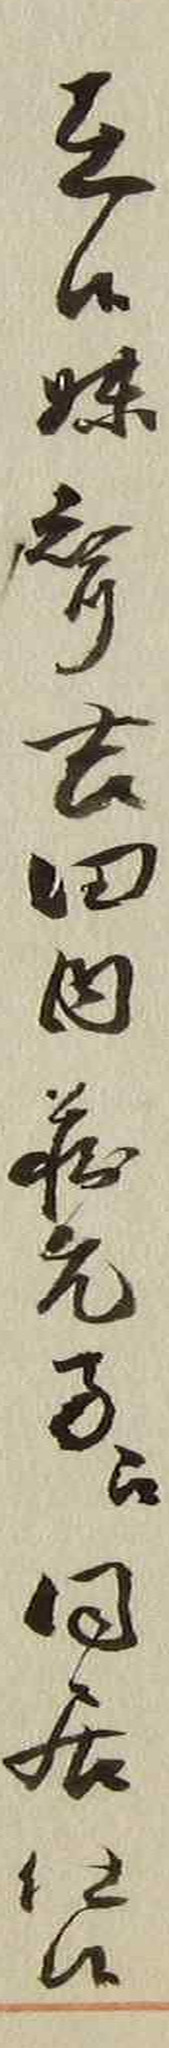在候妹婿吉田内蔵允方江同居仕候
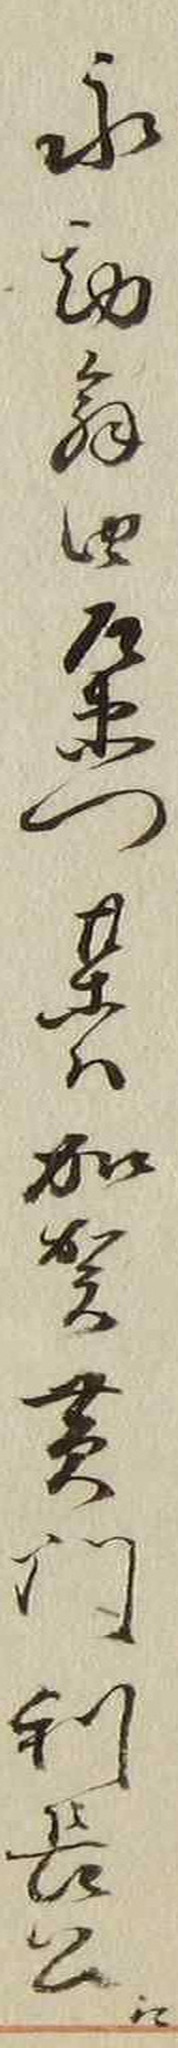永勘解由左衛門某ハ加賀黄門利長公江
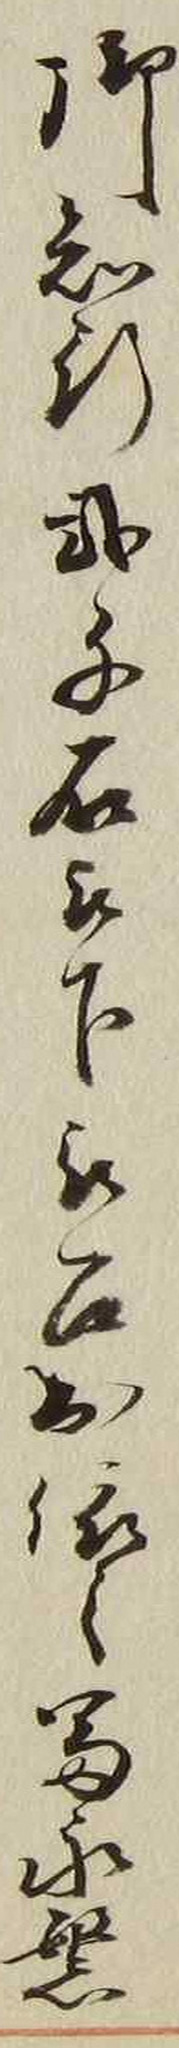御知行弐千石被下被召出依之富永繁
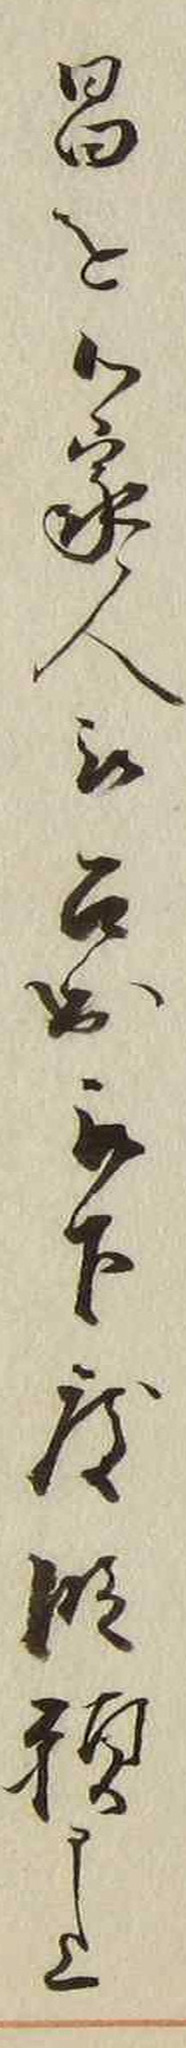昌を御家人被召出被下度段願申上
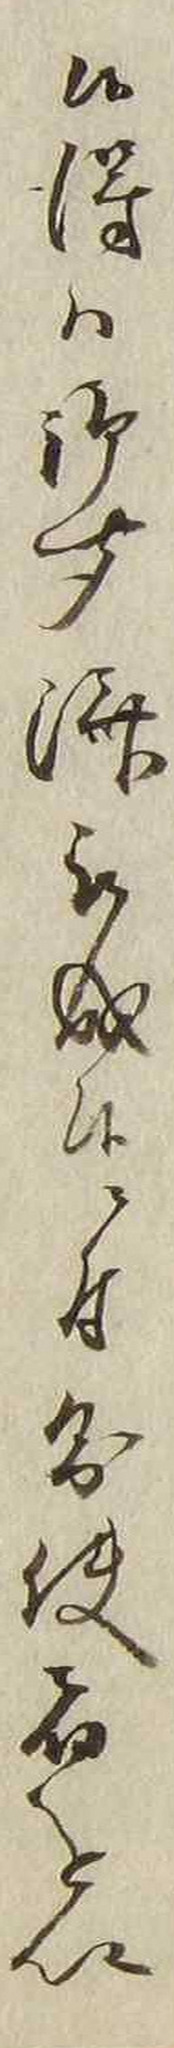候得ハ御聞済被成候ニ付則使者を以

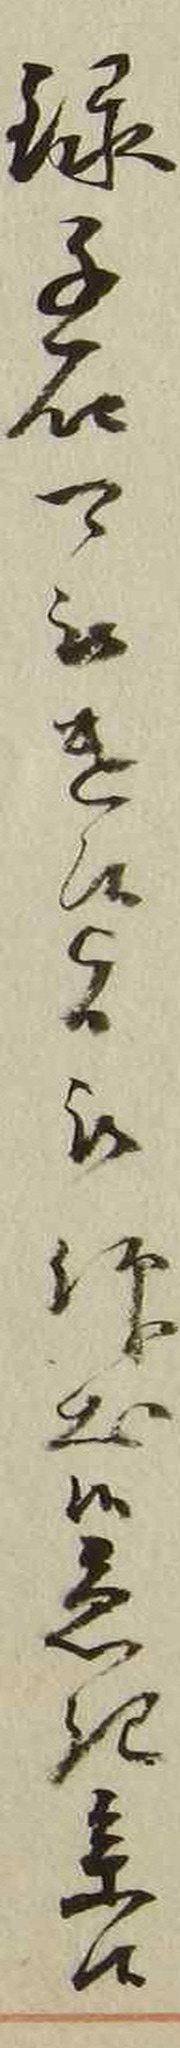録千石可被遣候旨被仰出候急き参候
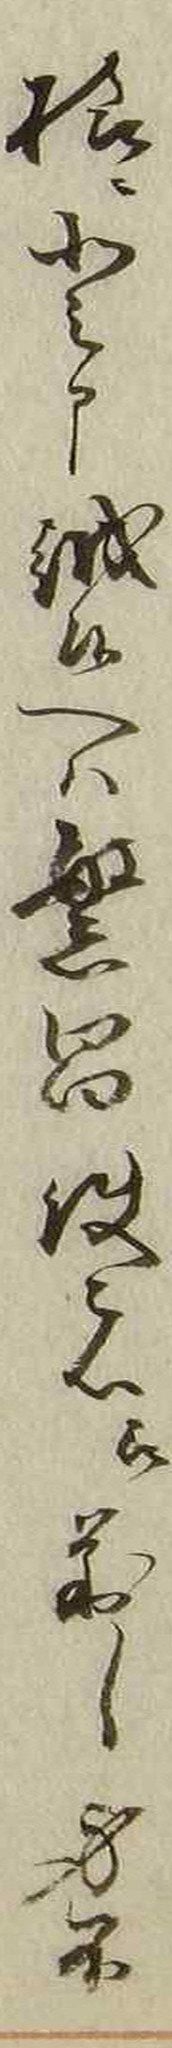様ニと申越候へハ繁昌使者江勤し身不
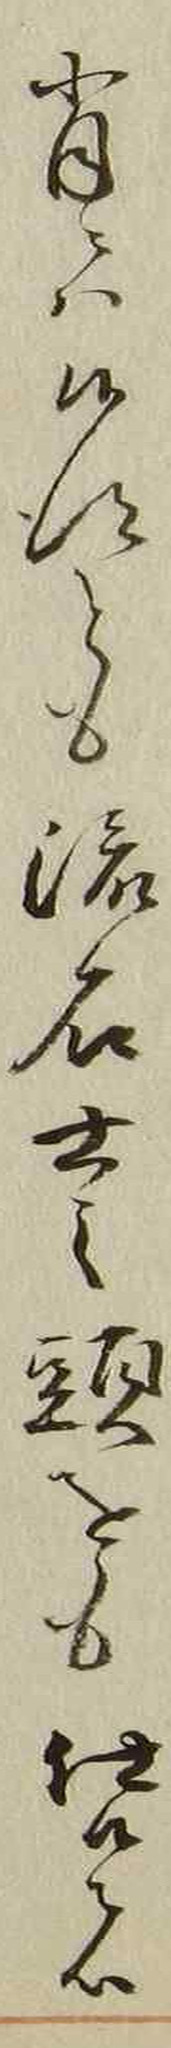肖ニハ候得とも流石士之頭をも仕候者
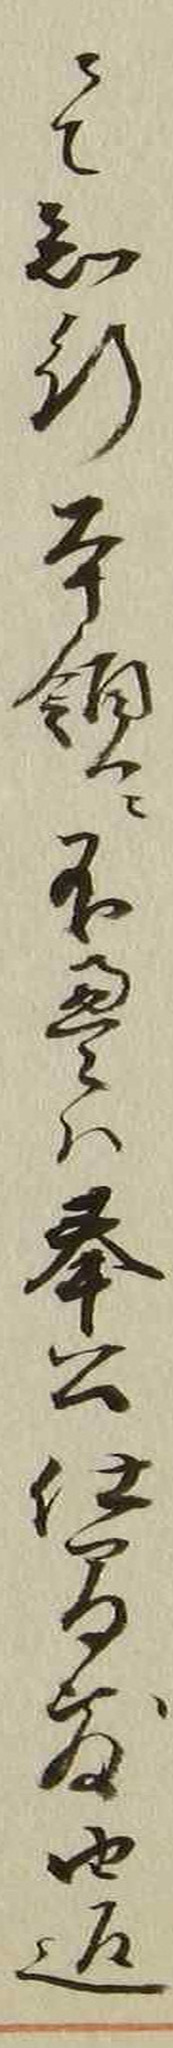ニて知行本領ニ不畳ハ奉公仕間敷由返
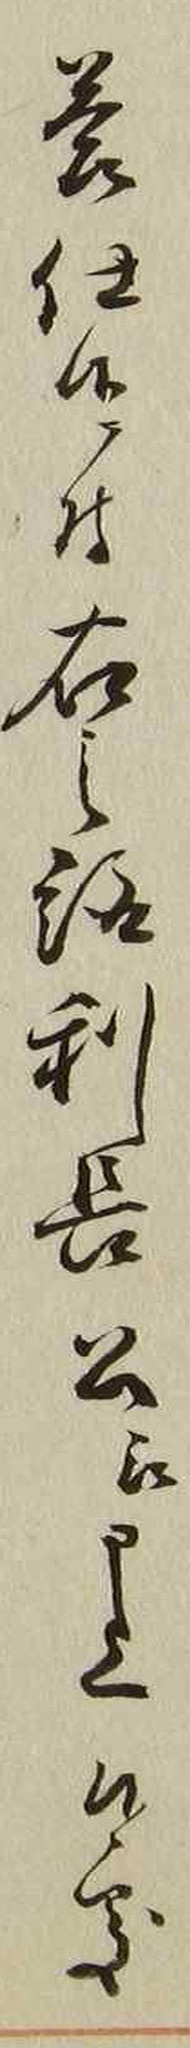答仕候ニ付右之趣利長公江申上候処
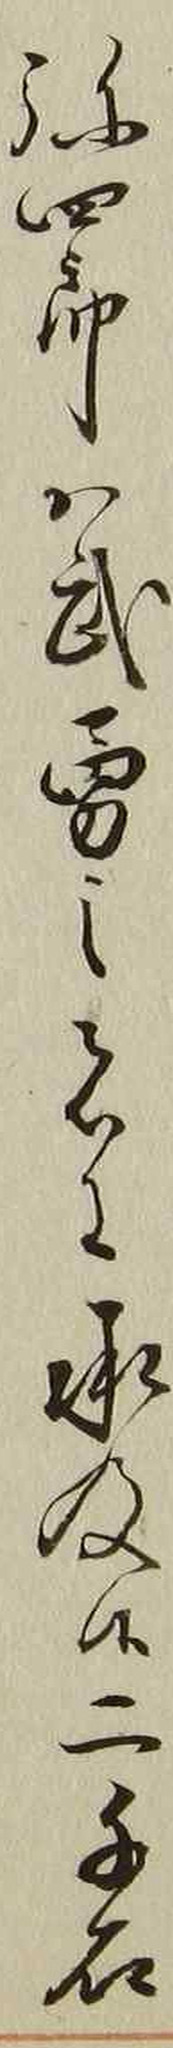弥四郎ハ武勇之者に承及候二千石
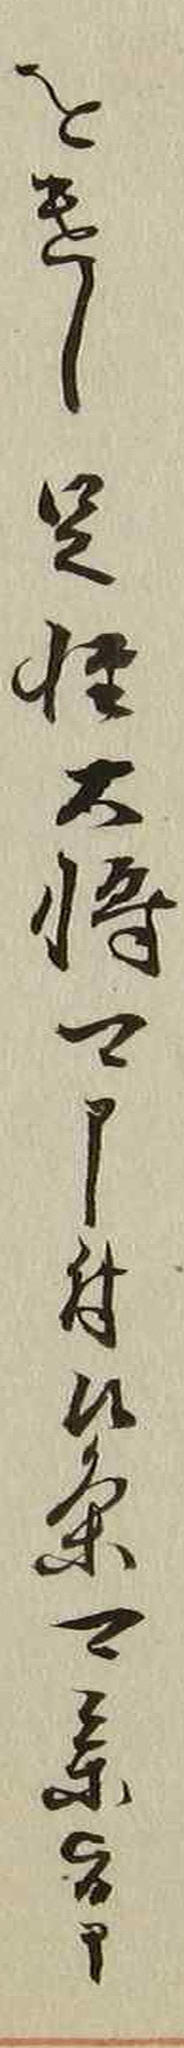を遣し足軽大将可申付候条可参旨申
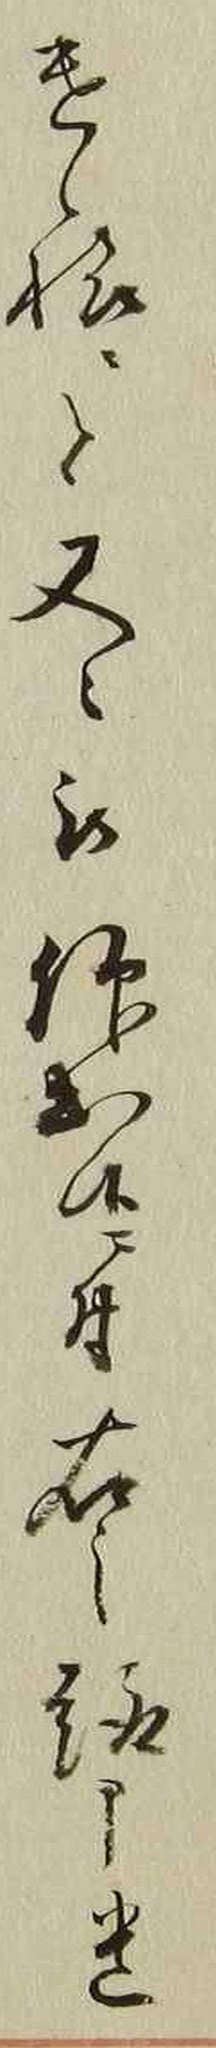遣候様ニと又々被仰出候ニ付右之趣申遣
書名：諸士系譜　巻之122　よ之部5
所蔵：会津若松市立会津図書館
